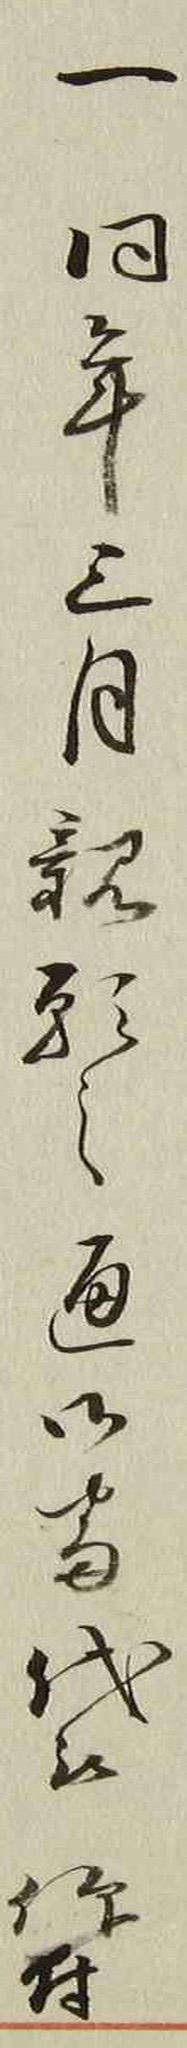一同年三月親願之通御番代被仰付
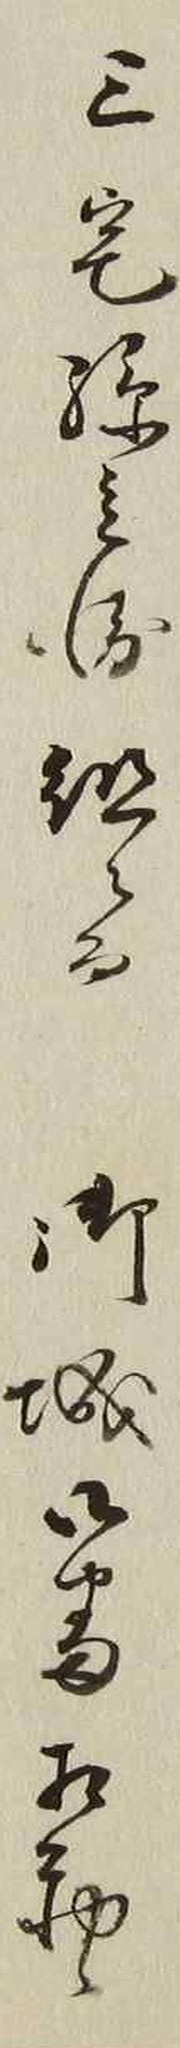三宅孫兵衛組ニ而御城御番相勤候
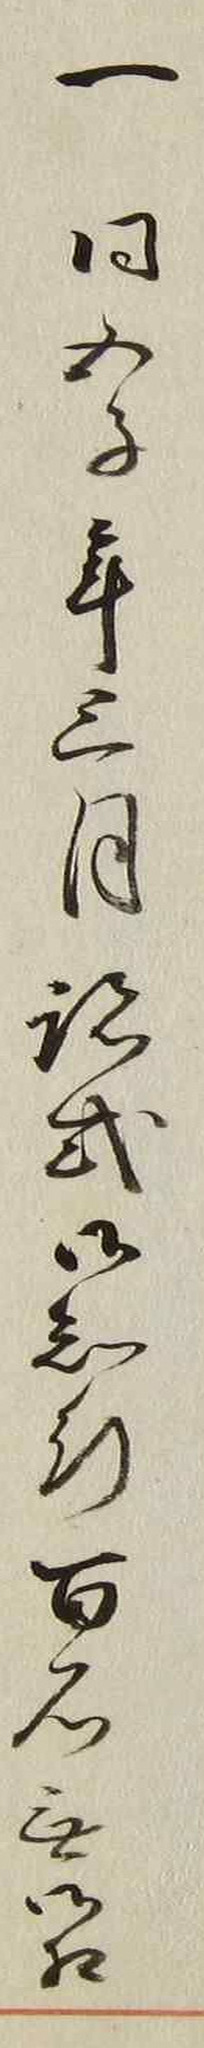一同五子年三月跡式御知行百石無御相
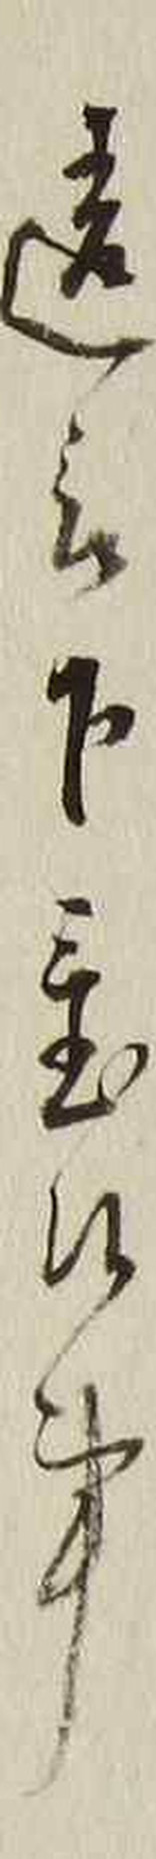違被下置候事
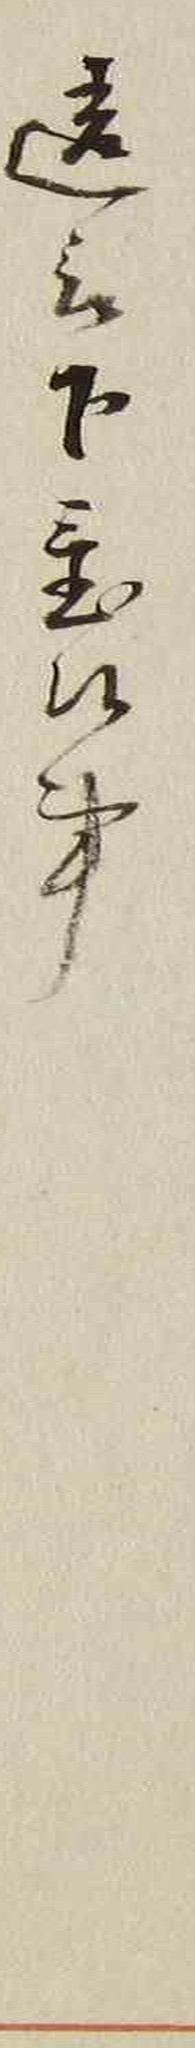違被下置候事
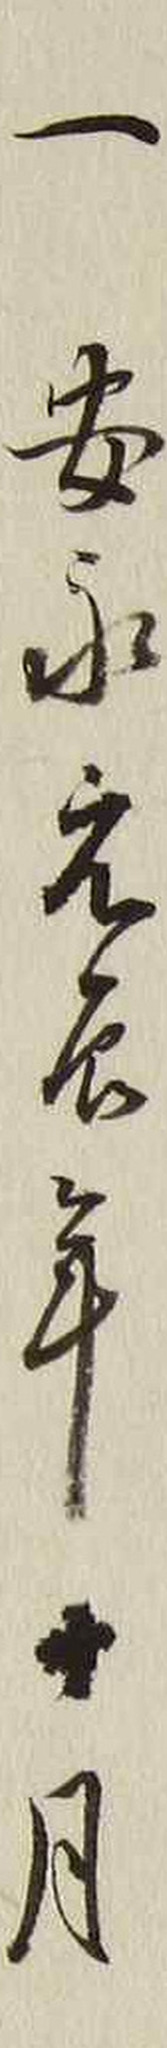一安永元辰年十月
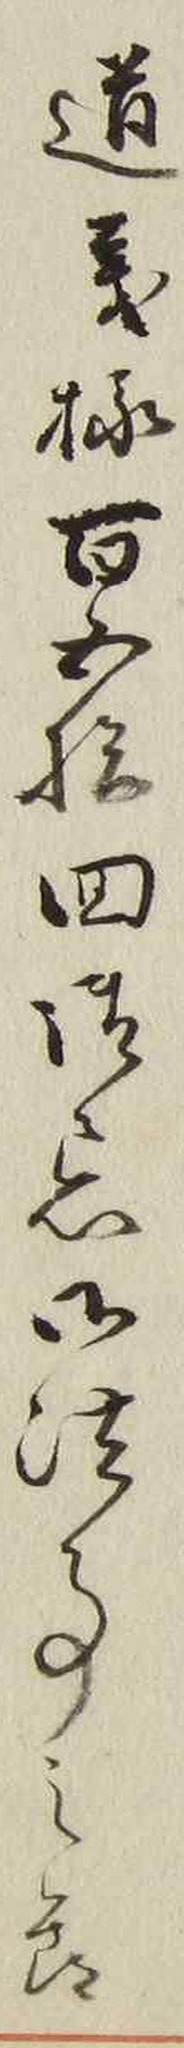道義様百五拾回御忌御法事之節
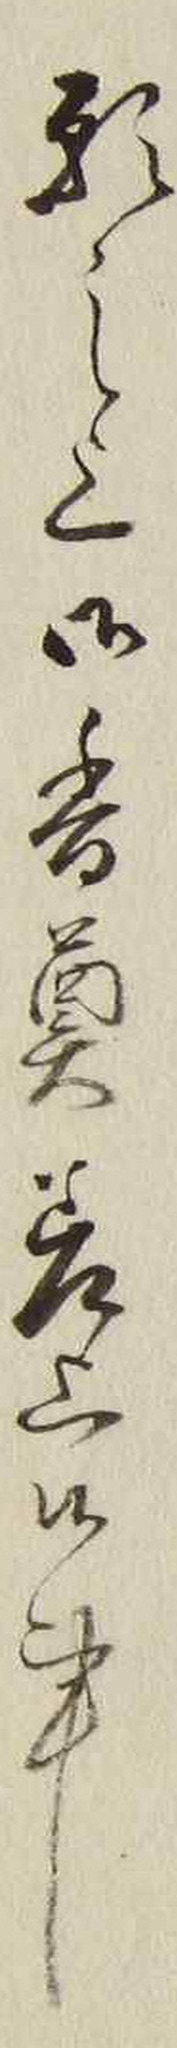願之上御香奠差上候事
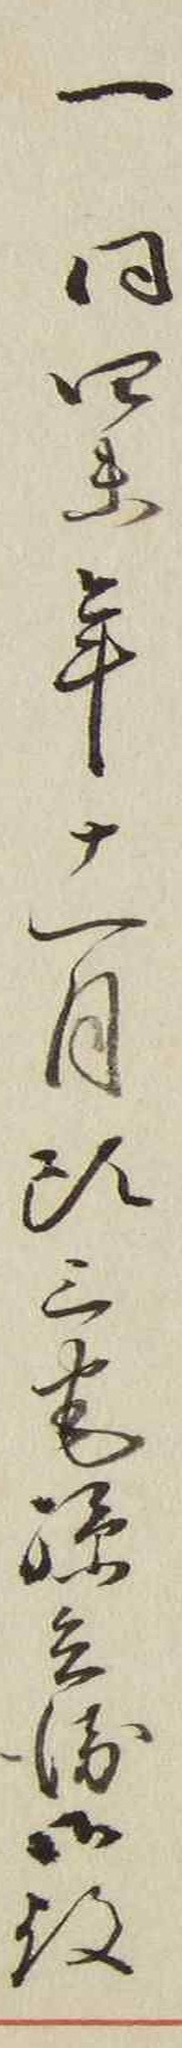一同四未年十一月頭三宅孫兵衛御役

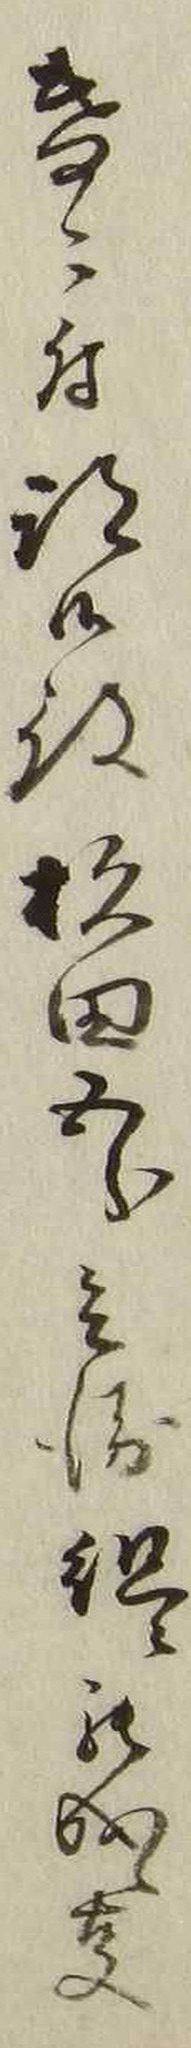替ニ付跡御役杉田五郎兵衛組ニ罷成候事
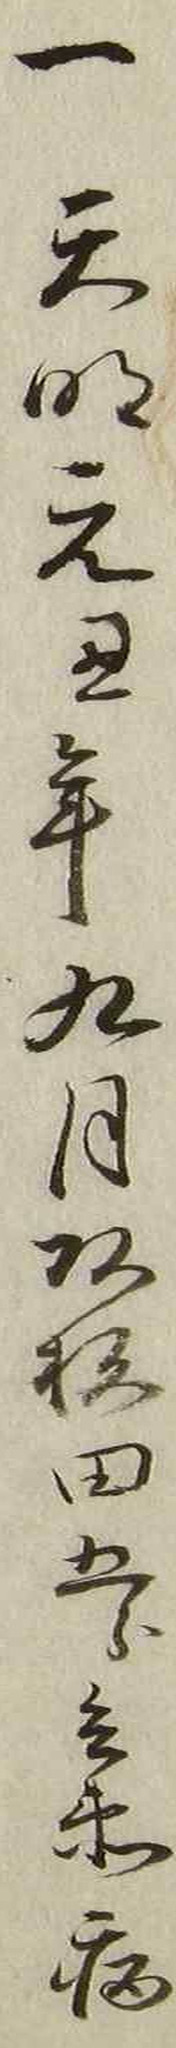一天明元丑年九月頭杉田五郎兵衛病
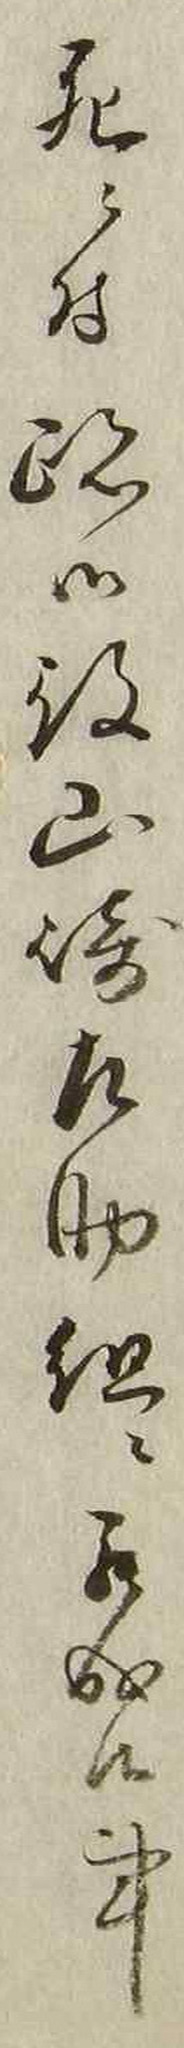死ニ付跡御役山崎左助組ニ罷成候事
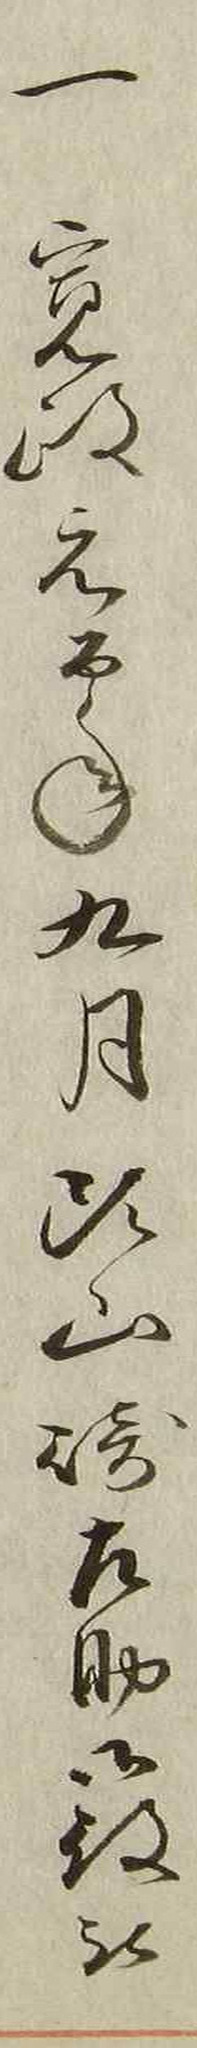一寛政元酉年九月頭山崎左助御役被
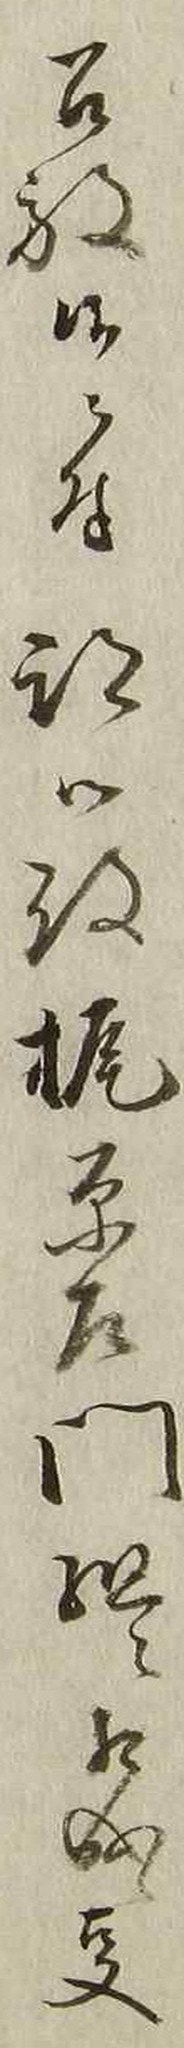召放候ニ付跡御役梶原左門組ニ罷成候事
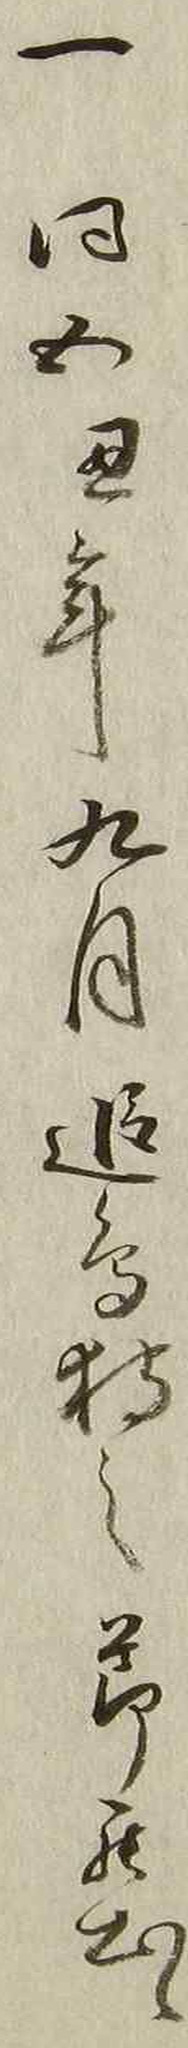一同五丑年九月追鳥狩之節罷出候
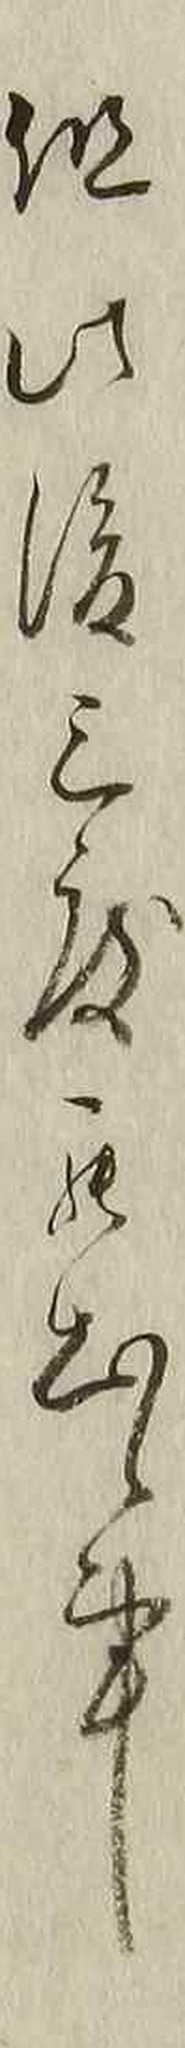但以後三度罷出候事
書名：諸士系譜　巻之26　い之部26
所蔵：会津若松市立会津図書館
